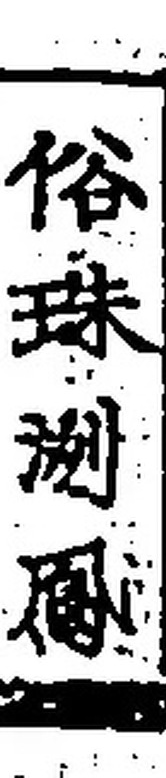俗珠洲鳳
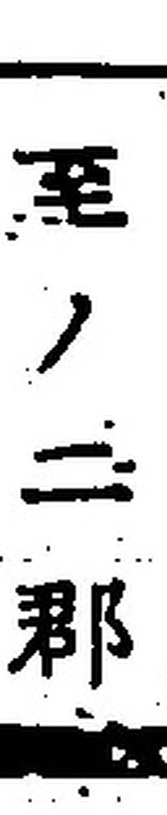至ノ二郡
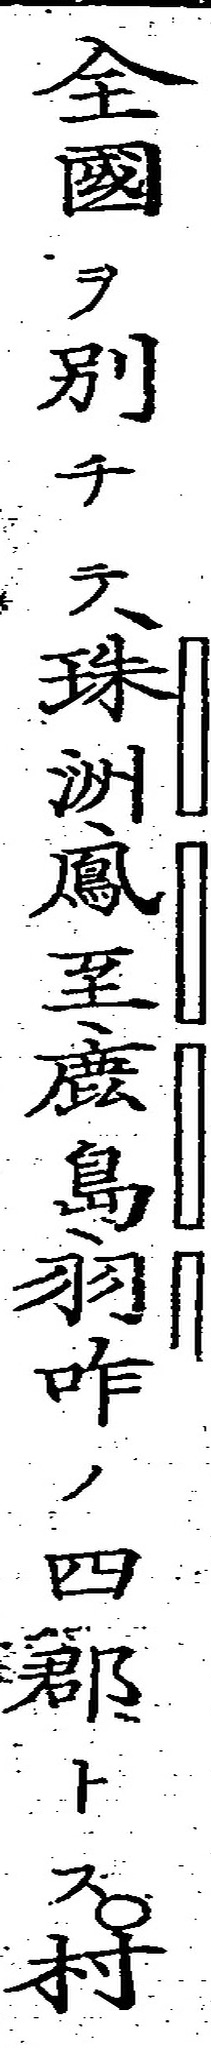全国ヲ別チテ、珠洲・鳳至・鹿島・羽咋ノ四郡トス。村
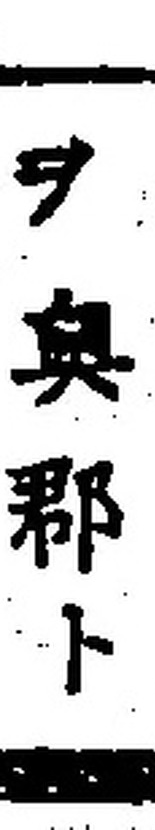ヲ奥郡ト
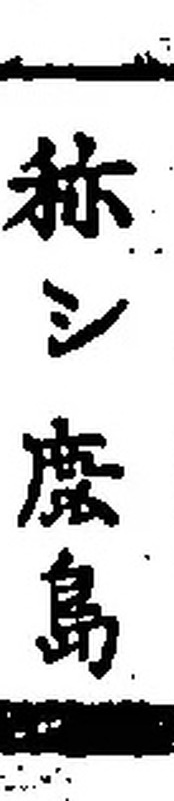称シ鹿島
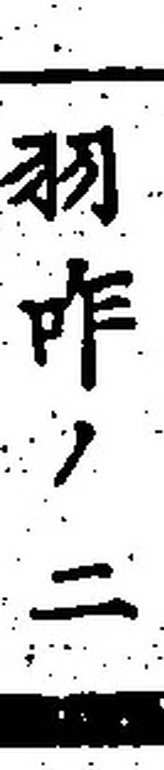羽咋ノ二
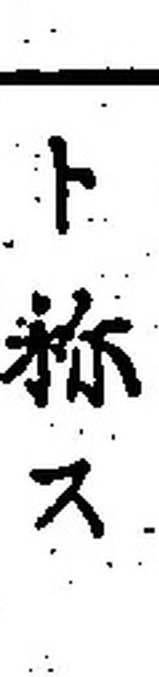ト称ス
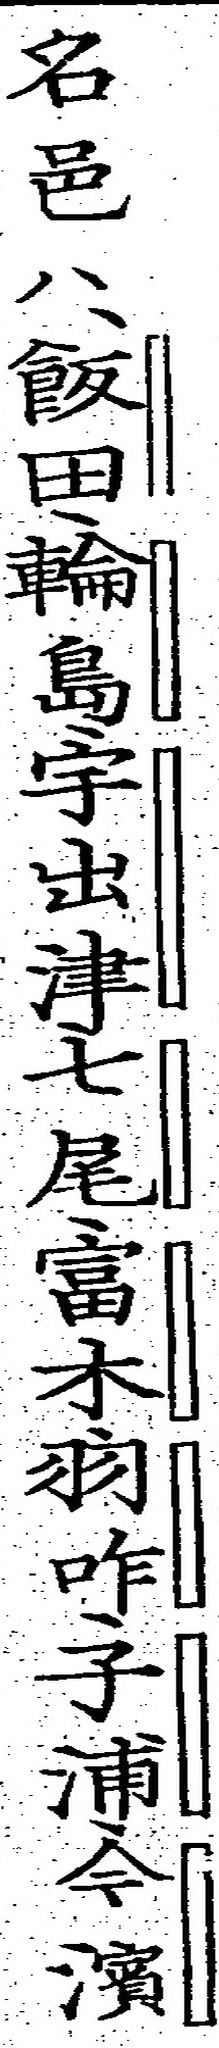名邑ハ、飯田・輪島・宇出津・七尾・富木・羽咋・子浦・今浜
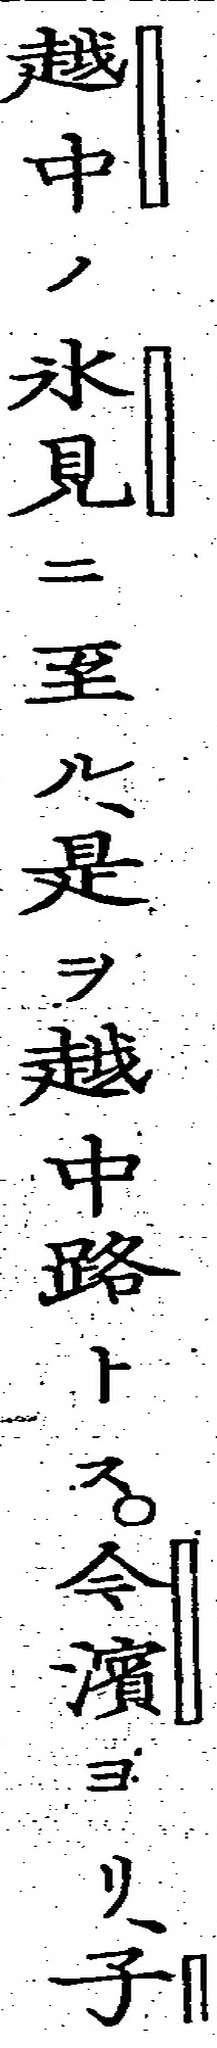越中ノ氷見ニ至ル、是ヲ越中路トス。今浜ヨリ、子
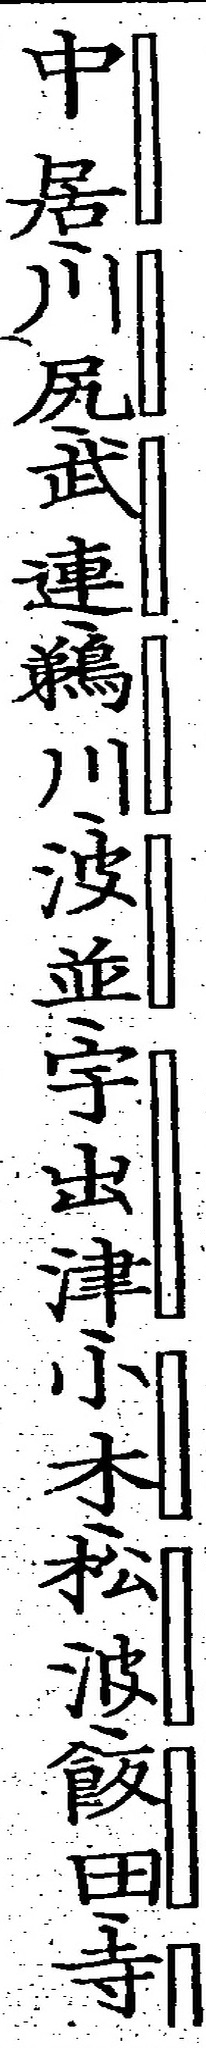中居・川尻・武連・鵜川・波並・宇出津・小木・松波・飯田・寺
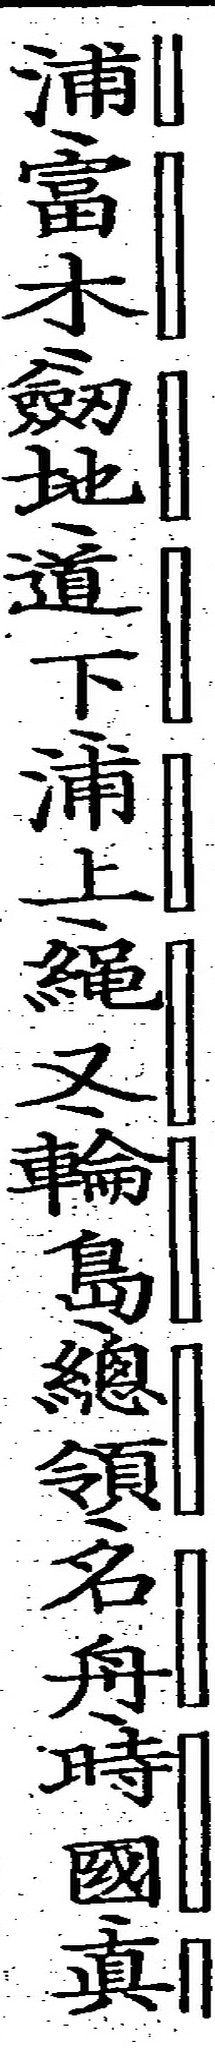浦・富木・劔地・道下・浦上・縄又・輪島・総領・名舟・時国・真

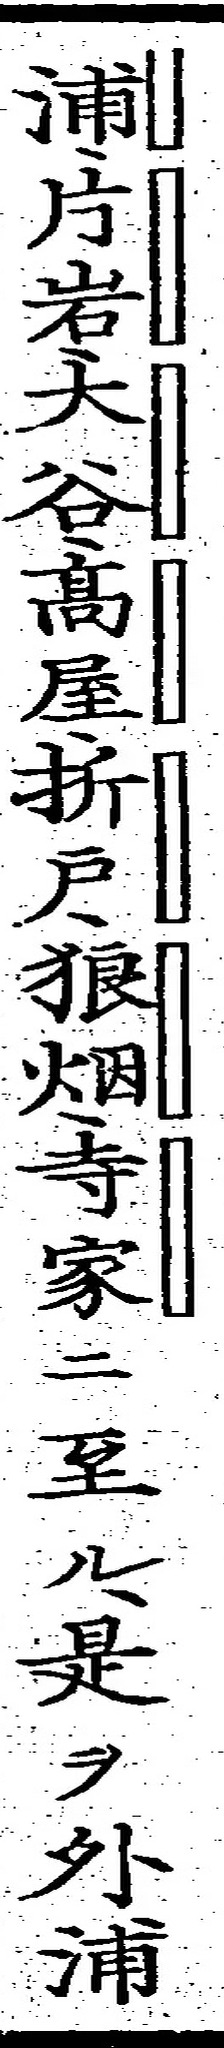浦・片岩・大谷・高屋・折戸・狼煙・寺家ニ至ル、是ヲ外浦
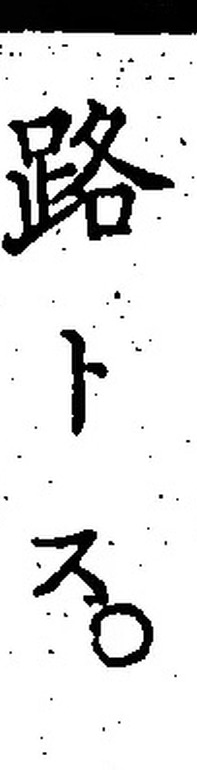路トス。
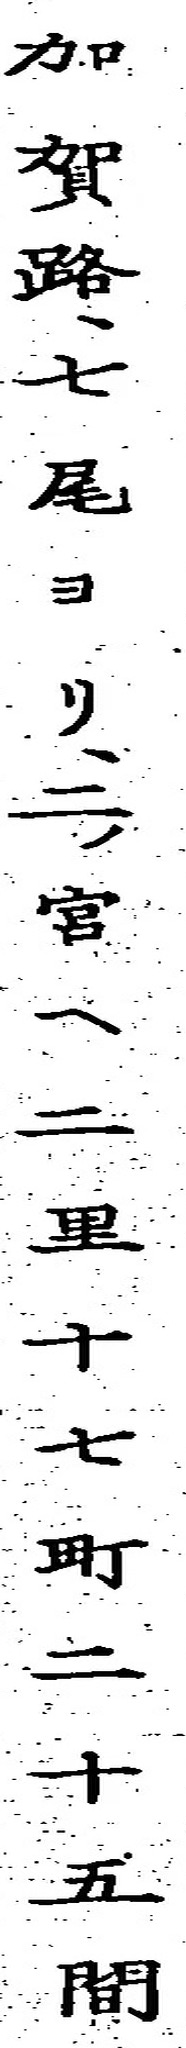加賀路、七尾ヨリ、二宮ヘ二里十七町二十五間
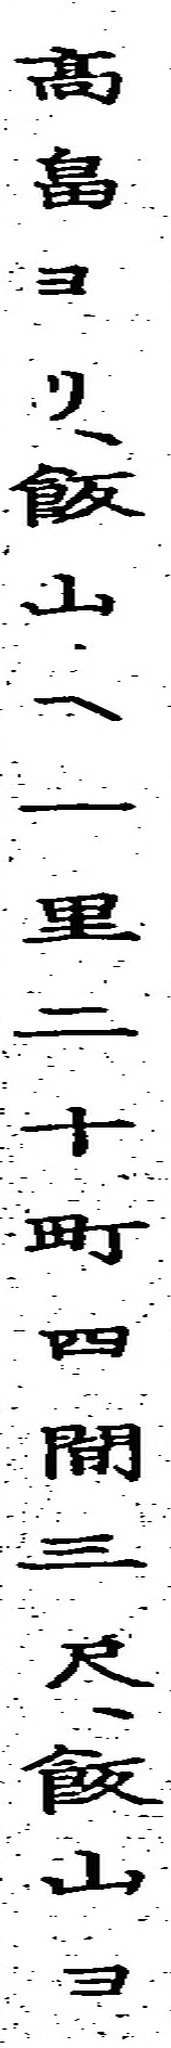高畠ヨリ、飯山ヘ一里二十町四間三尺、飯山ヨ
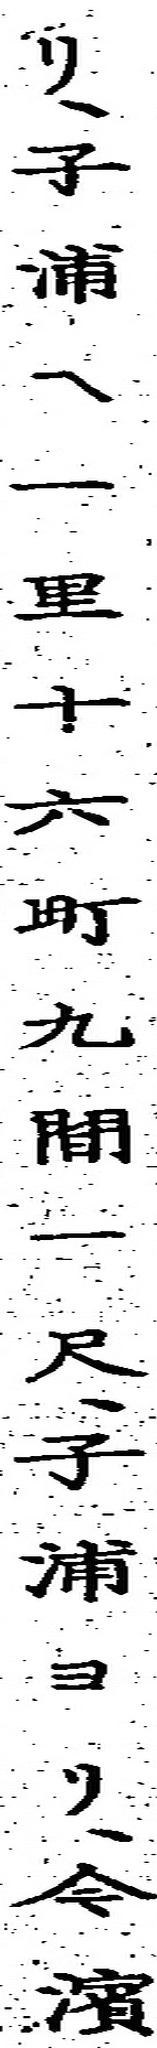リ、子浦ヘ一里十六町九間一尺、子浦ヨリ、今浜
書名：能登地誌略
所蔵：国立国会図書館 National Diet Library, JAPAN
